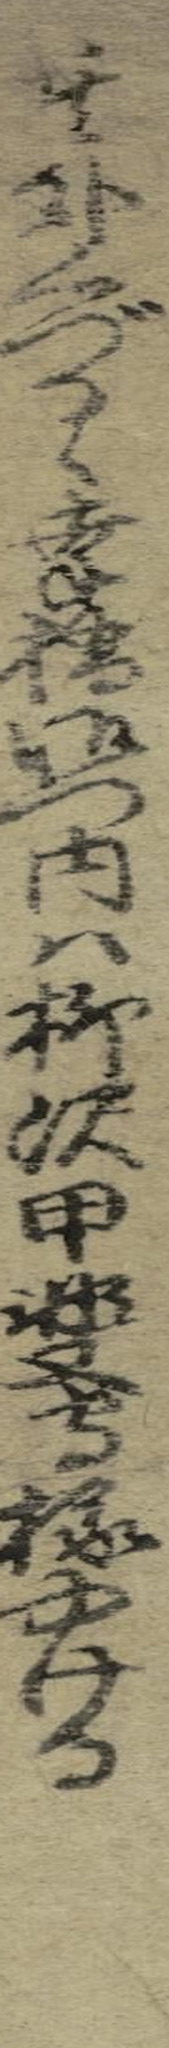其外くづるゝ幸橋御門内は柳沢甲斐守様やける
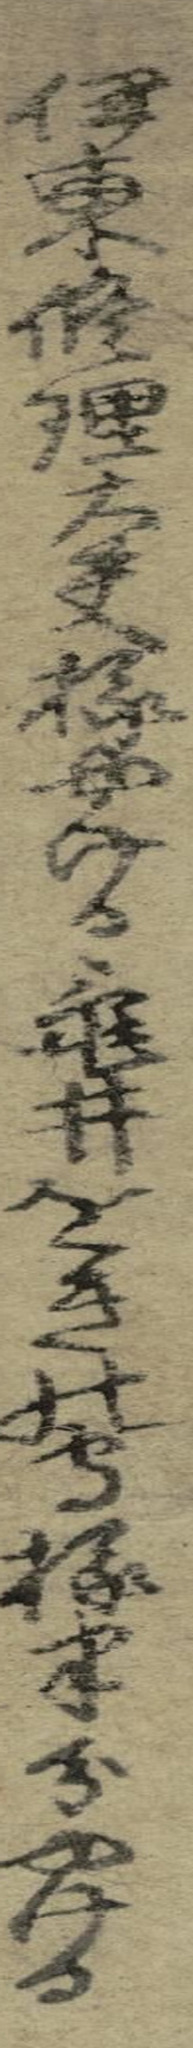伊東修理太夫様やける亀井をきの守様半分やける
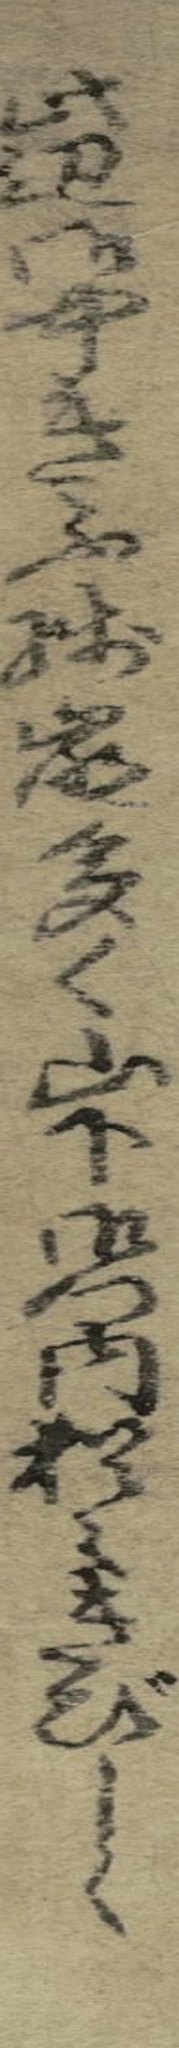此辺御やしき不残崩多く山下御門内猶々きびしく
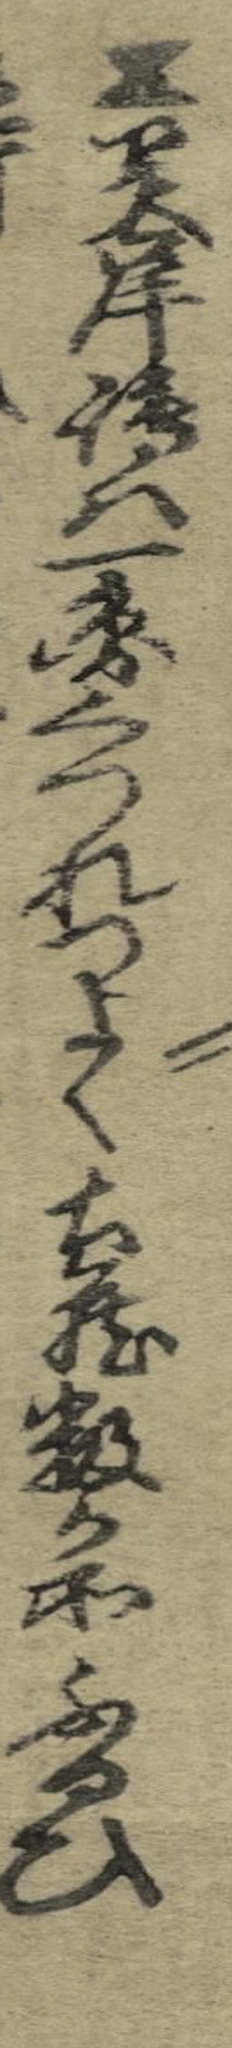☆霊岸嶋は一円くつれつよく土蔵数ヶ所ふるひ
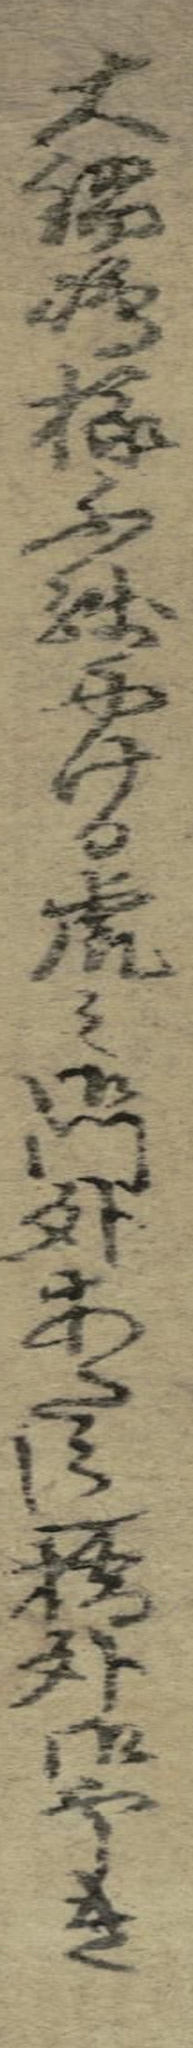大鍋嶋様不残やける虎之御門外あたらし橋外御やしき
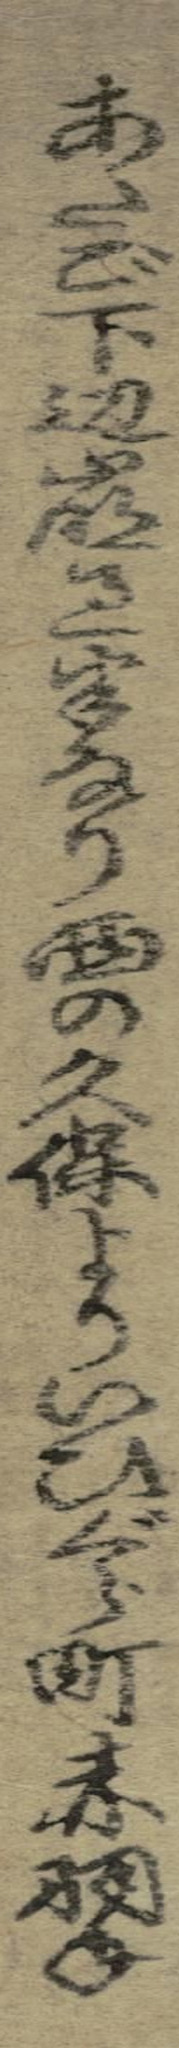あたご下辺崩過半なり西の久保よりいひぐら町赤羽年
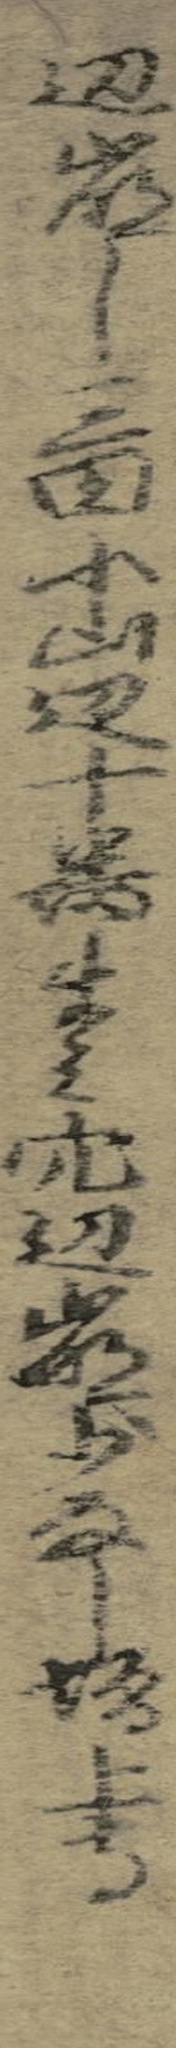辺崩し三田小山辺十番まみ穴辺崩少なし増上寺
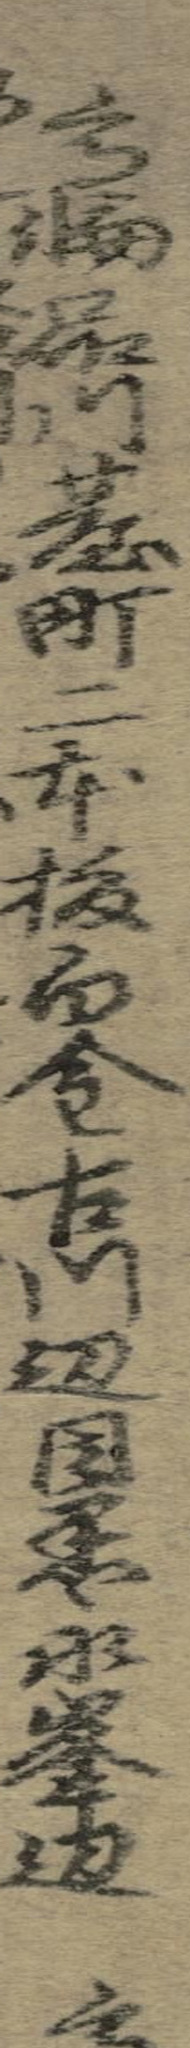高輪品川台町二本榎白金古川辺目黒永峯辺
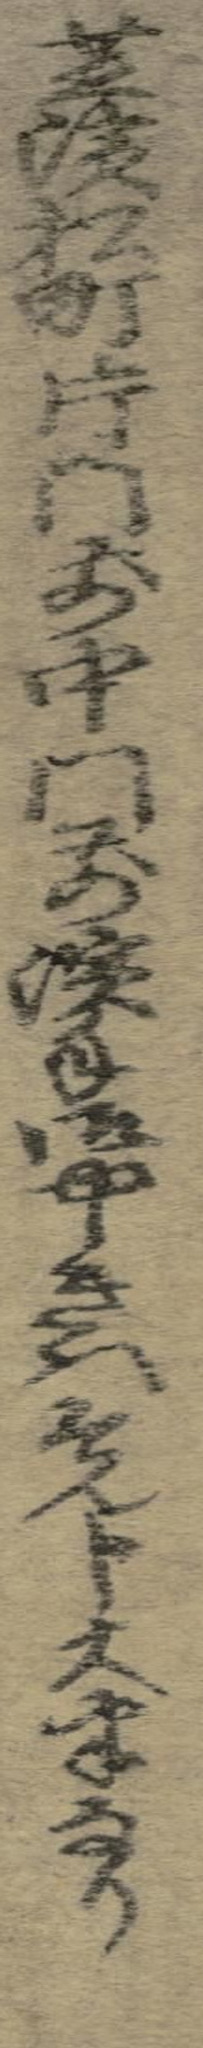芝浜松町片門前中門前浜手御やしきはそんじ大半なり
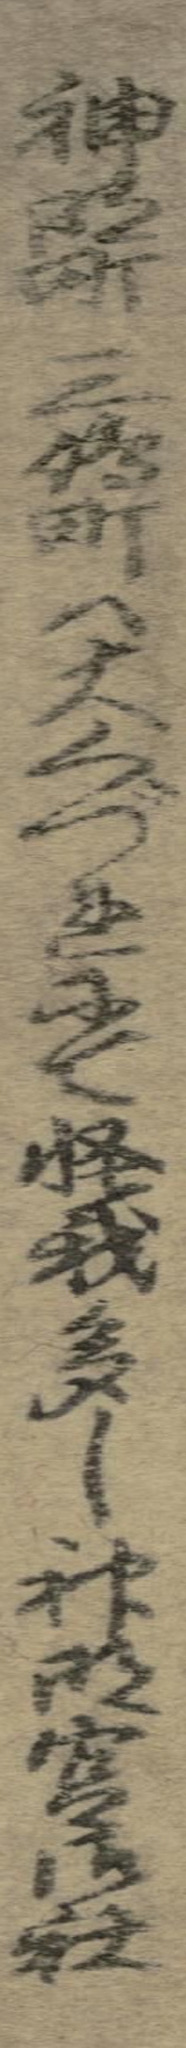神明町三嶋町は大くづれにて怪我多し神明宮御社
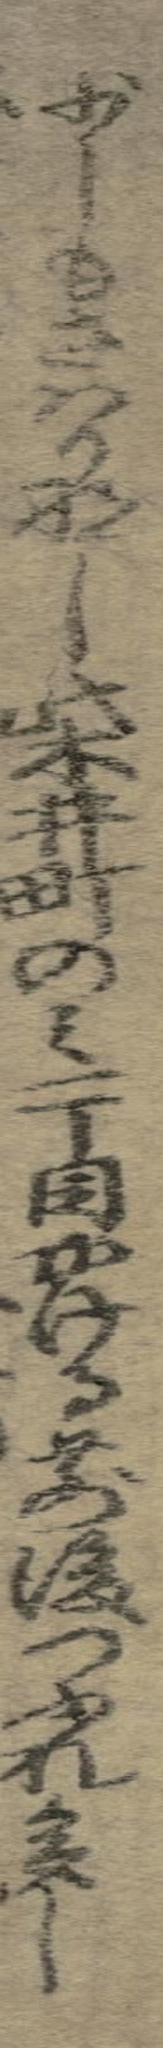少しもさはりなし柴井町のみ一丁目やける前後つぶれ多し
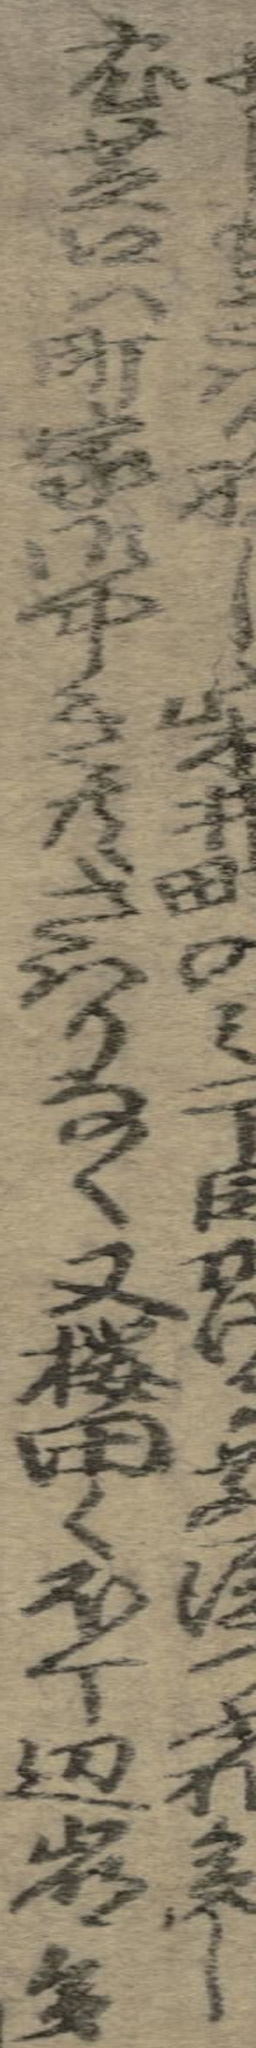尤芝口は町家御やしき共さはりなく又桜田くほ丁辺崩多し
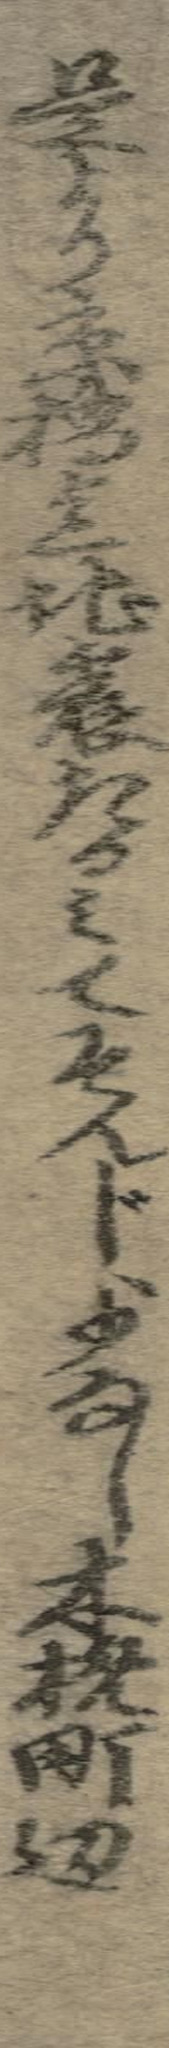是より京橋迄地震たるみてそんじ少なし木挽町辺
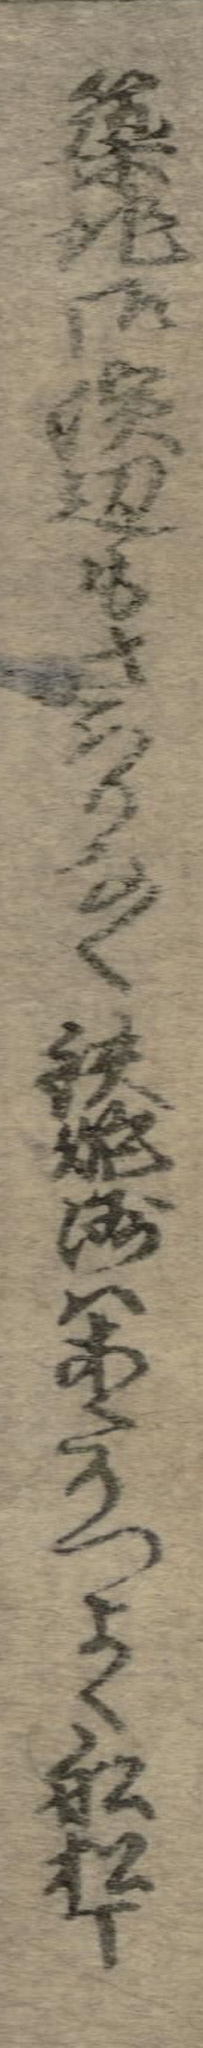築地御浜辺もさはりなく鉄炮洲はあたりつよく船松丁
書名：安政二卯十月二日大地震附類焼場所
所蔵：東京大学地震研究所図書室 Earthquake Research Institute Library, The University of Tokyo, JAPAN
